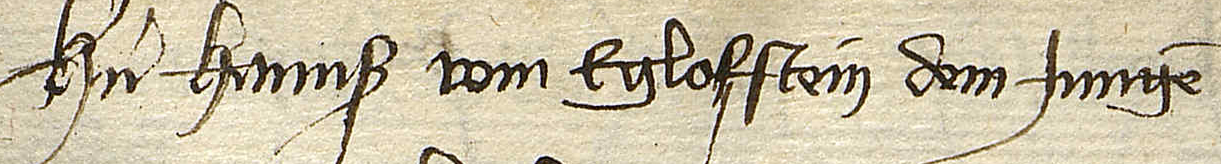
Hn* hannſ* vom Eglofſtein dem Iunge*
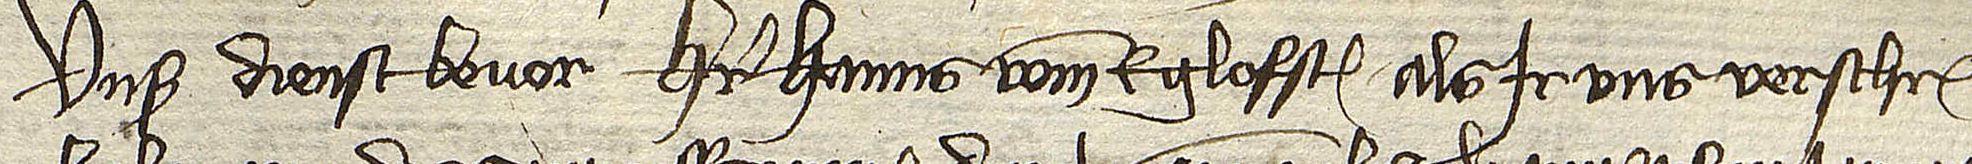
Vnſ* dienſt beuor Hr* Hanns vom* Eglofſt* / als Ir vns verſchr*
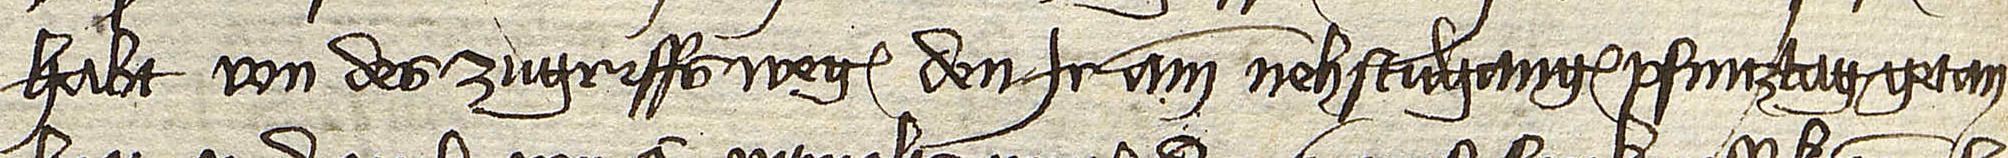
habt von des ʒugriffs weg* den Ir am* nehſtu*gang* pfincʒtag getan
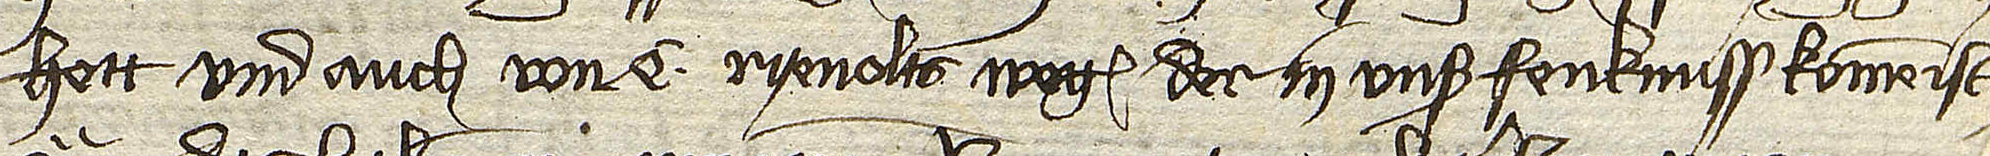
hett vnd auch von . C . ryenolts weg* / der in vnſ* fenknuſſ kome* iſt
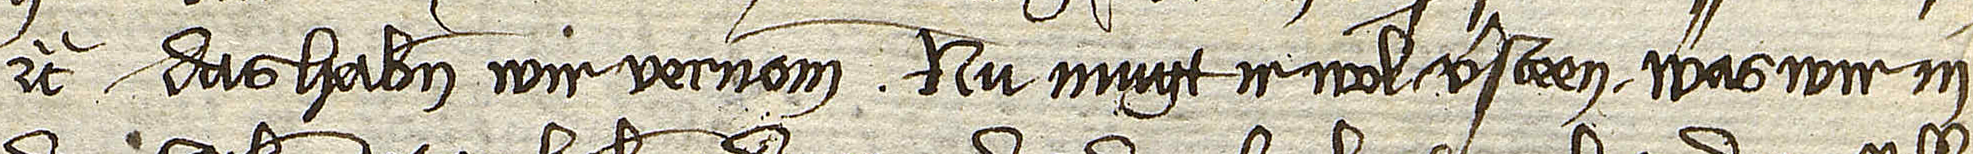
ec* / das habn* wir vernom* . Nu mugt ir wol v*ſteen / was wir in
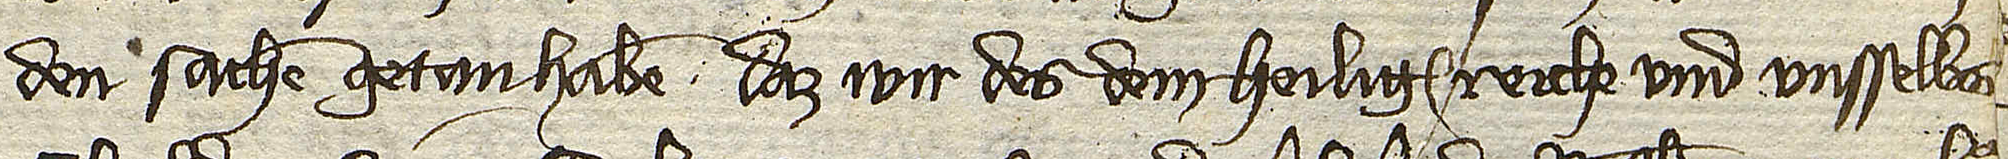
den ſache* getan habe* / Daʒ wir des dem heilig* reiche vnd vnſſelbs
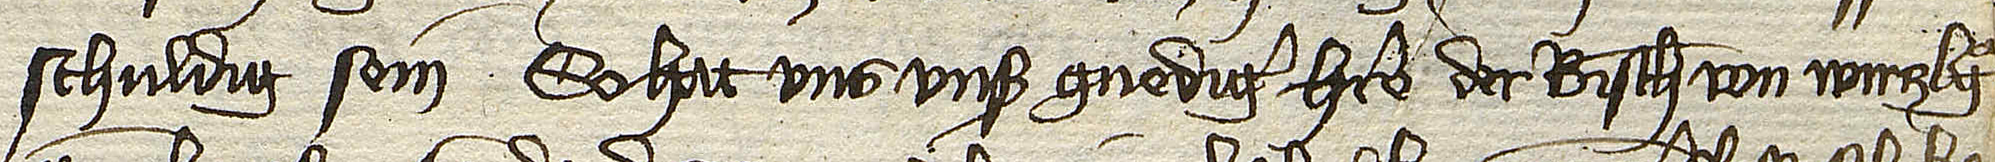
ſchuldig ſein . So hat vns vnſ* gnedig* h*re der Biſch* von wircʒb*g
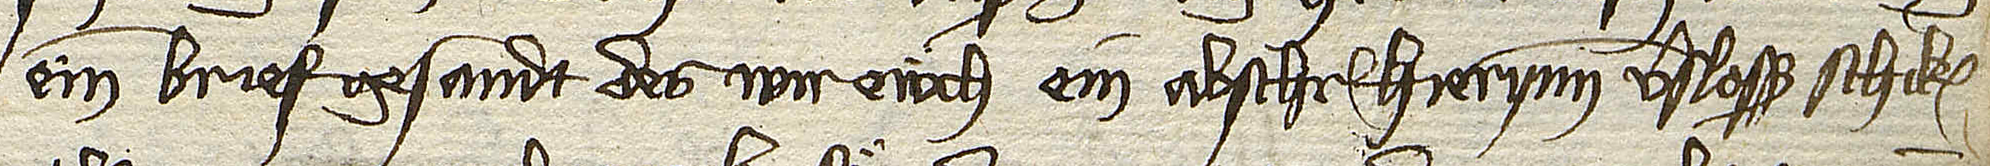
ein* brief geſandt des wir eẅch ein abſchr* hierynn* v*ſloſſ* ſchik*
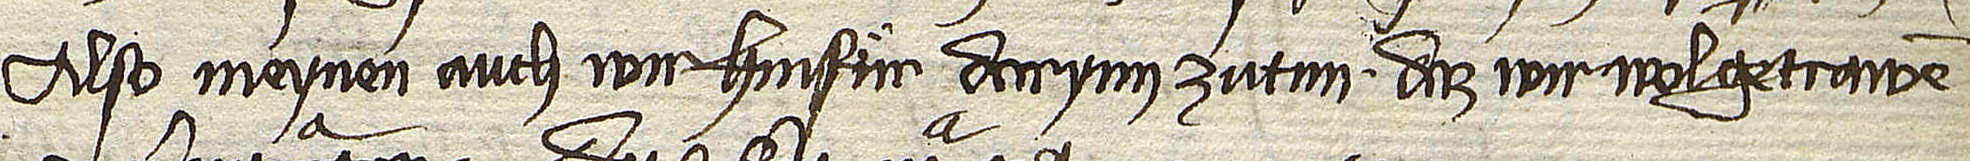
Alſo meynen auch wir hinfür darynn ʒutun . daʒ wir wol getrawe*
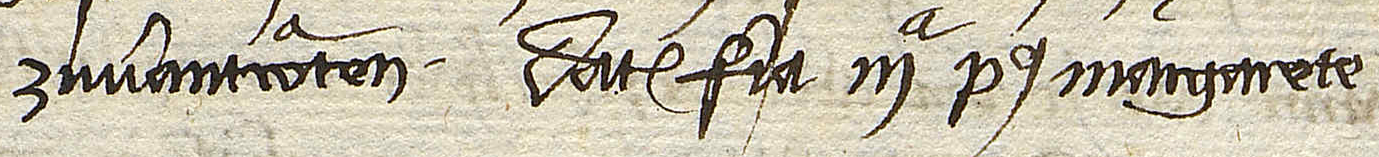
ʒuu*antw*ten / Dat* fi*a iii* p* margarete
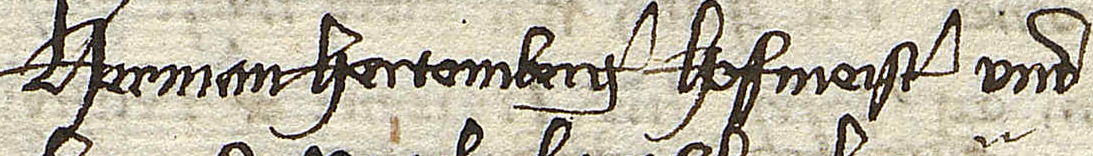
Herman hertemberg* hofmeiſt* vnd
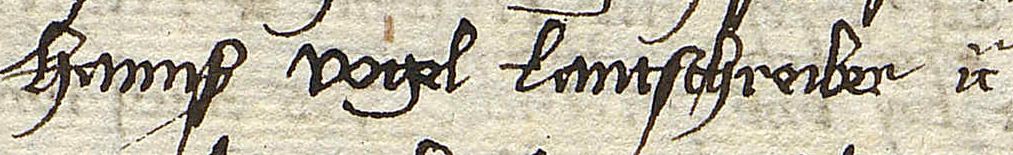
hannſ* vogel lantſchreiber ec*
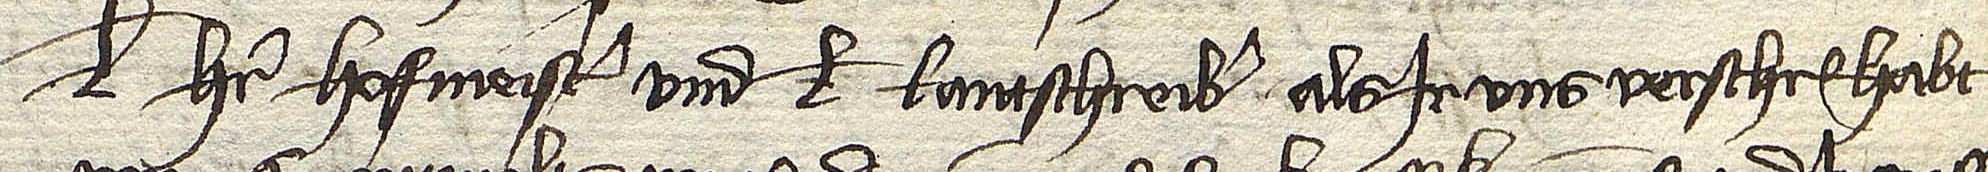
L* hr* hofmeiſt* vnd L* lantſchreib* als Ir vns verſchr* habt
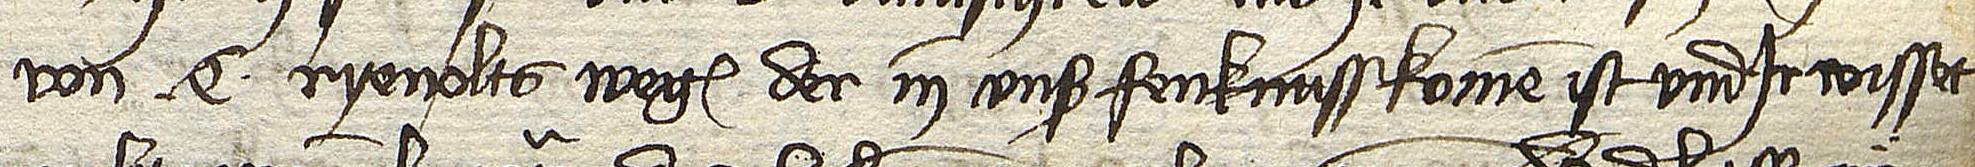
von . C . ryenolts weg* der in vnſ* fenknuſſ kome* iſt vnd Ir wiſſet
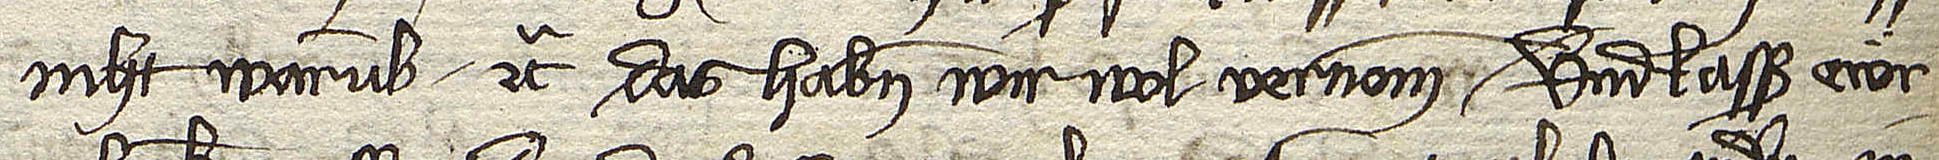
niht warub* / ec* / Das habn* wir wol vernom* / Vnd laſſ* eẅr
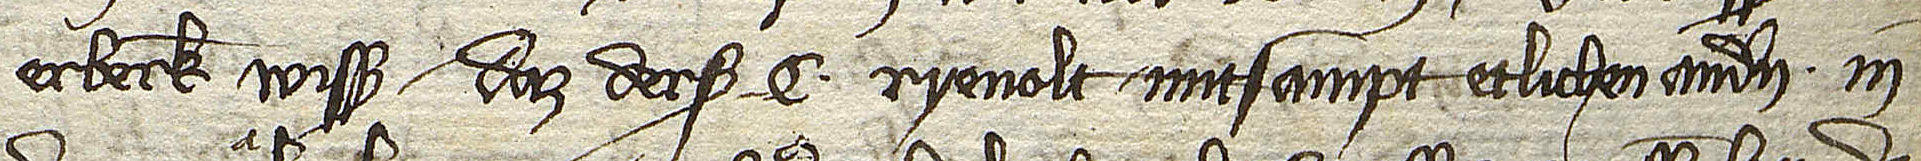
erberbk* wiſſ* / Daʒ derſ* . C . ryenolt / mitſampt etlichen and*n . in
